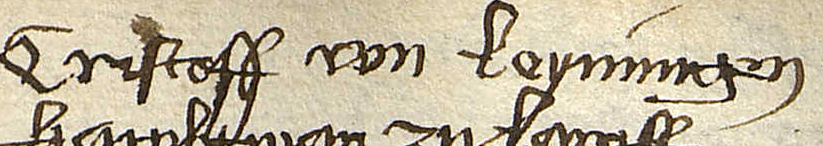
Criſtoff von leymingen
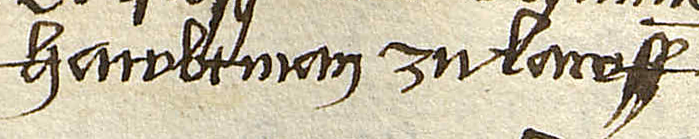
Hawbtman ʒu lawff
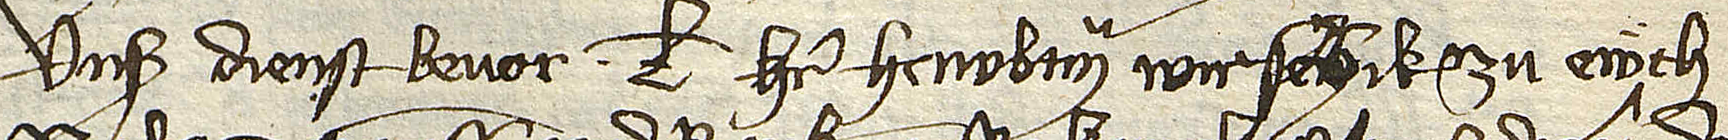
Vnſ* dienſt beuor . L* hr* hawbtm* wir ſchik* ʒu eẅch
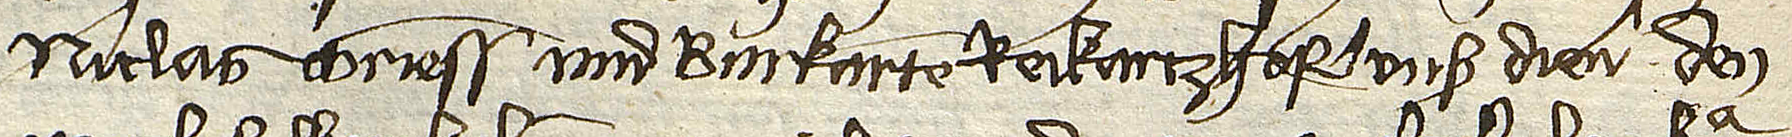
Niclas Grieſſ vnd Burkarte* Reikarcʒhof* vnſ* dien* . den
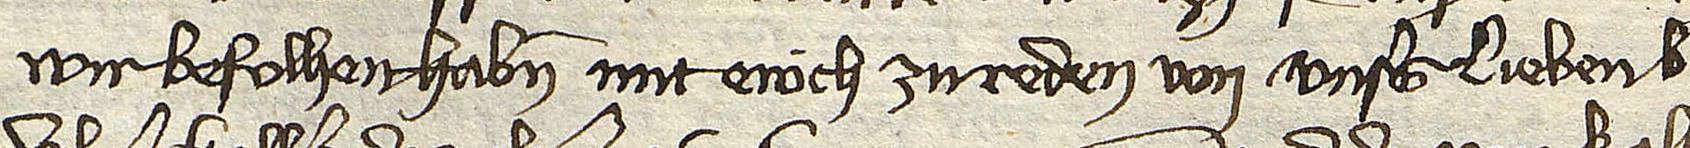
wir befolhen habn* mit eẅch ʒureden von vnſ*s lieben b*
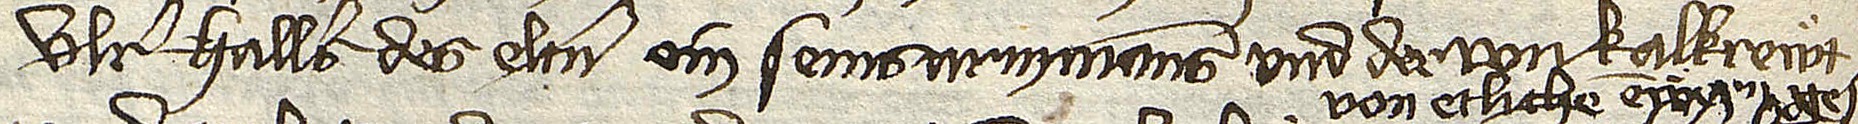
Vlr* hall*s des eltn* ein ſeins armmans* vnd der von kalkreẅt
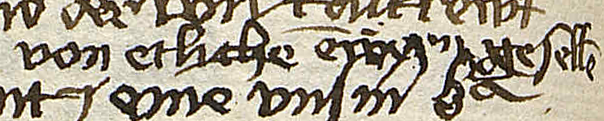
von etliche* eẅern geſelle*
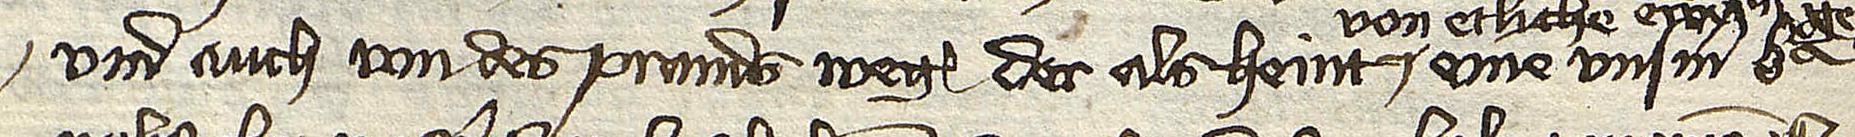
/ vnd auch von des prands weg* der als heint eine* vnſm* b*
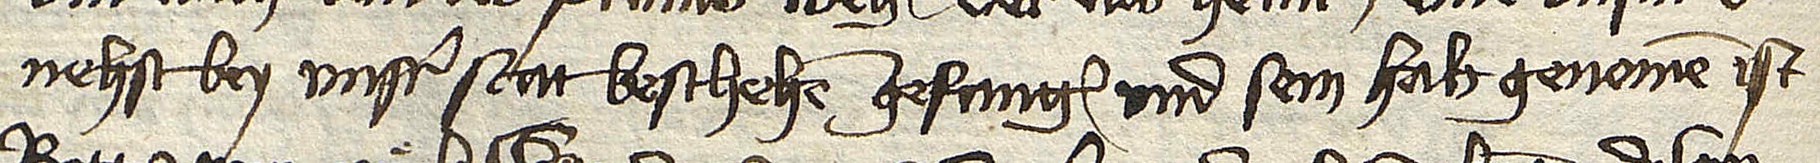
nehſt bey vnſr* ſtat beſchehe* gefang* vnd ſein hab genome* iſt
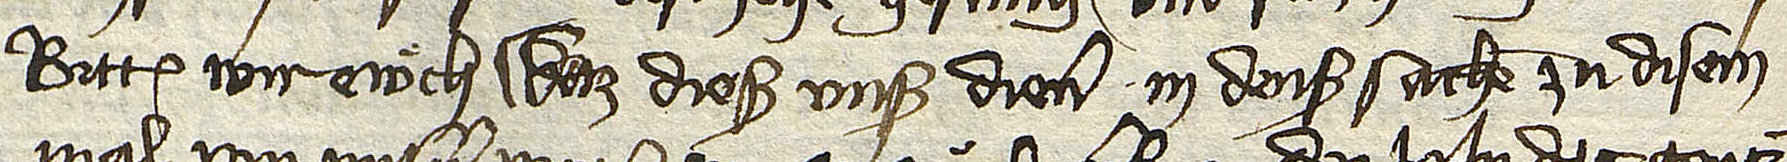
Bitt* wir eẅch / daʒ dieſ* vnſ* dien* . in denſ* ſache* ʒu diſem
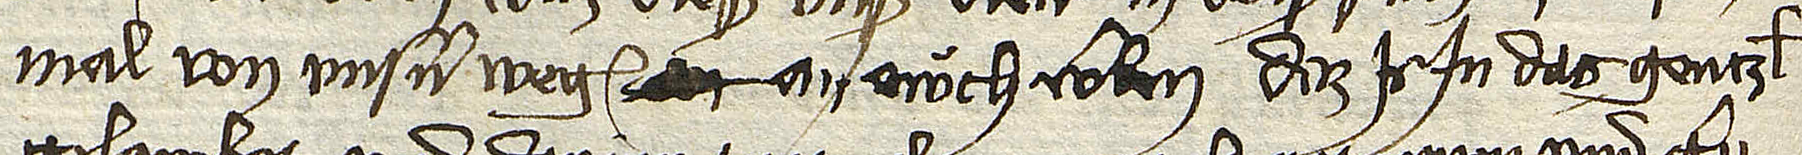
mal von vnſn* weg* an an eẅch w*ben daʒ Ir In das gencʒl*
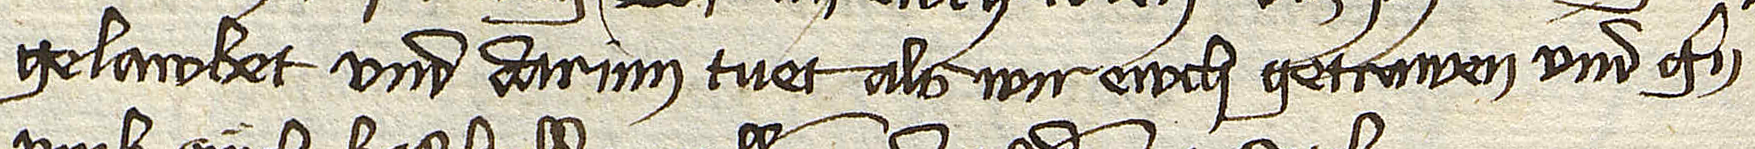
gelawbet vnd darinn tuet als wir ewch getrawen vnd g*n
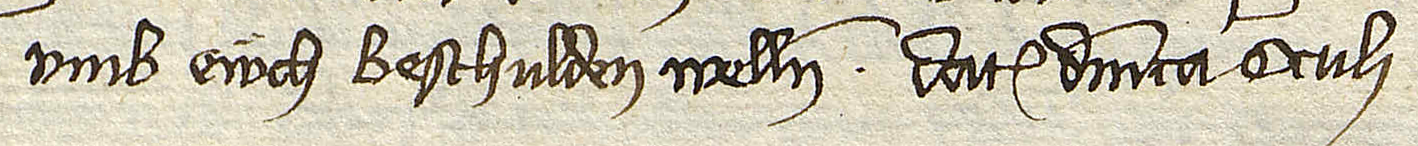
vmb eẅch beſchulden welln* . Dat* dni*ca Oculi
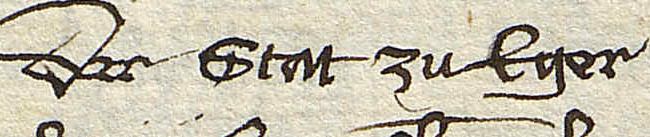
Der Stat ʒu Eger
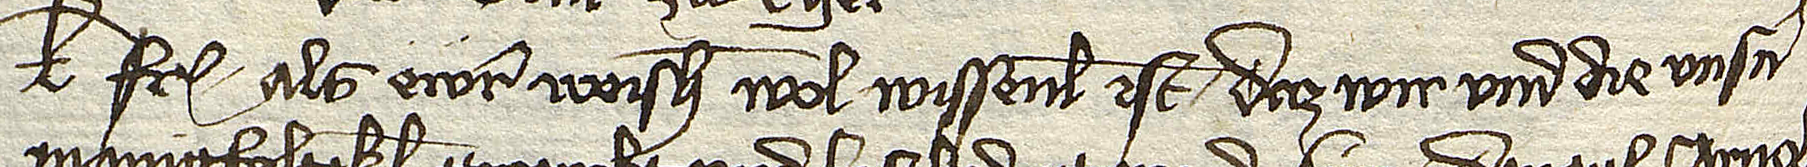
L* fr* als eẅr* weiſh* wol wiſſenl* iſt / Daʒ wir vnd die vnſn*
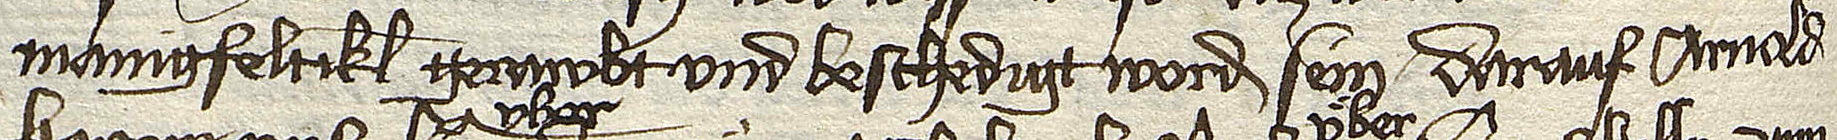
manifeltikl* gerawbt vnd beſchedigt word* ſein / Darauf Arnold
